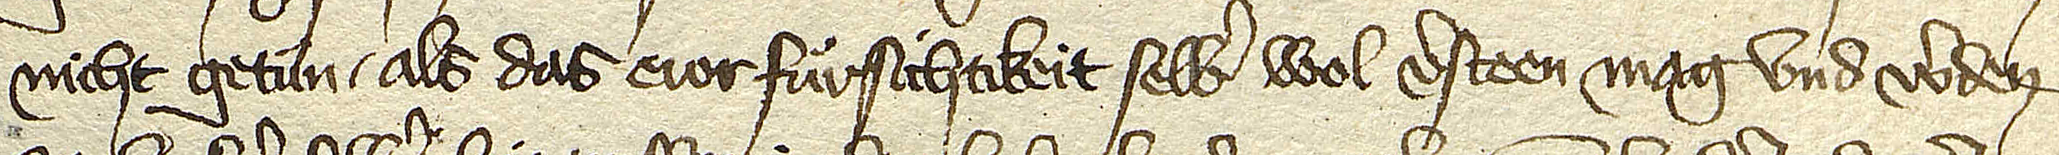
nicht getün / als das ewr fürſtlichkeit ſelb* wol v*ſteen mag vnd w*den
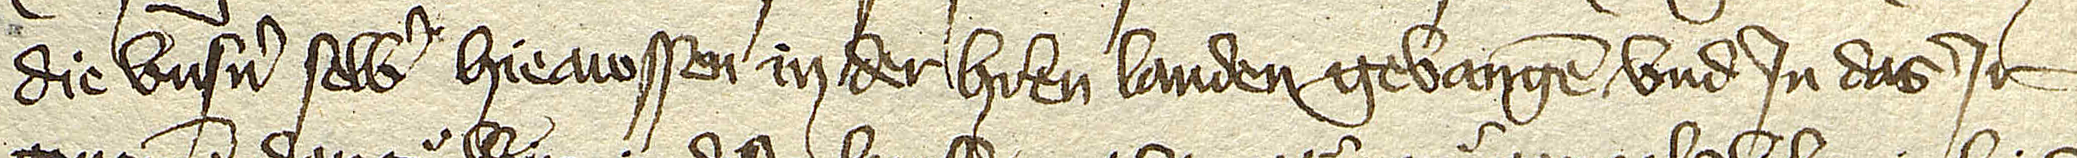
die vnſn* ſelb* hieawſſen in der hr*en landen gevange* / vnd In das Ir
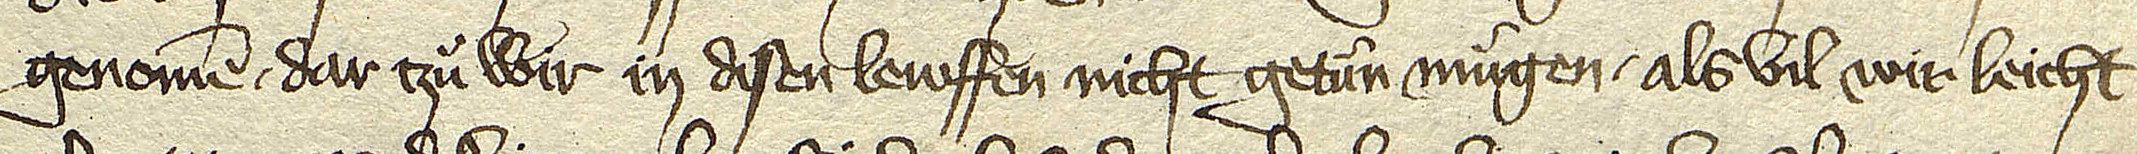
genome* / dar cʒü wir in diſen lewffen nicht getün mügen / als vil wir leicht
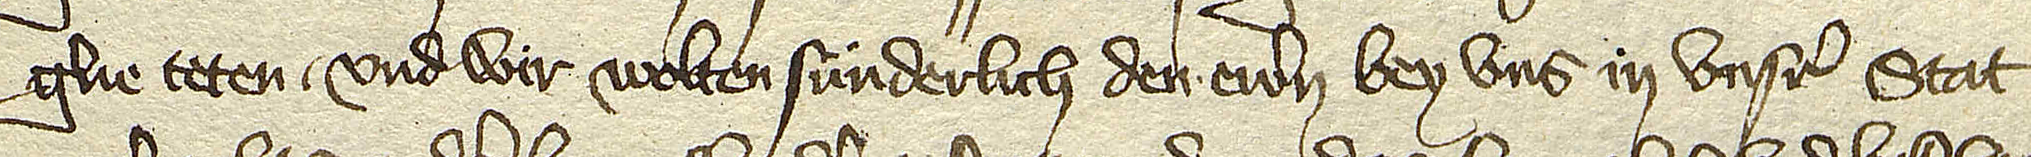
g*ne teten / vnd wir wolten ſünderlich den ew*n bey vns in vnſr* Stat
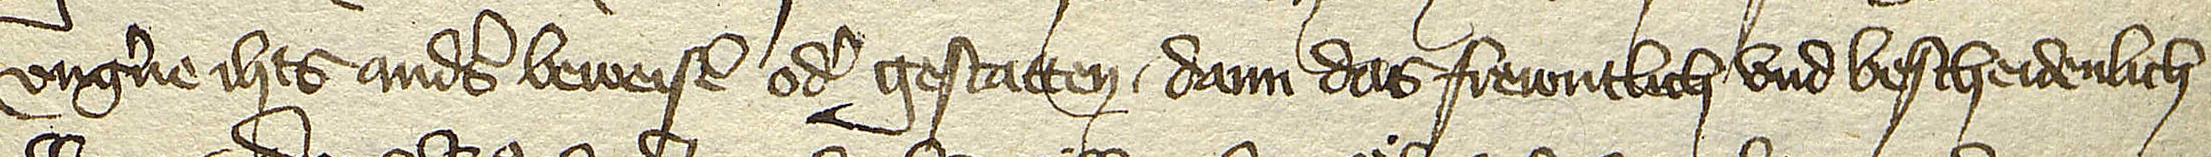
vng*ne ihts ands* beweiſe* od* geſtatten / dann das frewntlich vnd beſcheidenlich
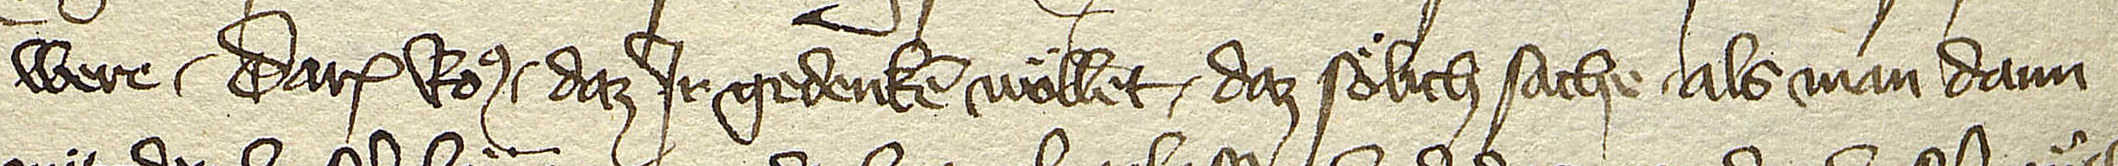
were / Dar* Ro* / daʒ Ir gedenke* wöllet / daʒ ſölich ſache / als man dann
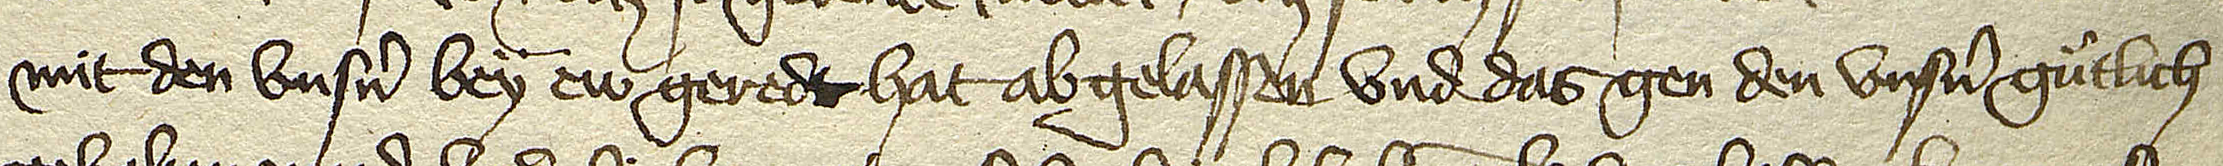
mit den vnſn* bey ew geredt hat abgelaſſen vnd das gen den vnſn* gütlich
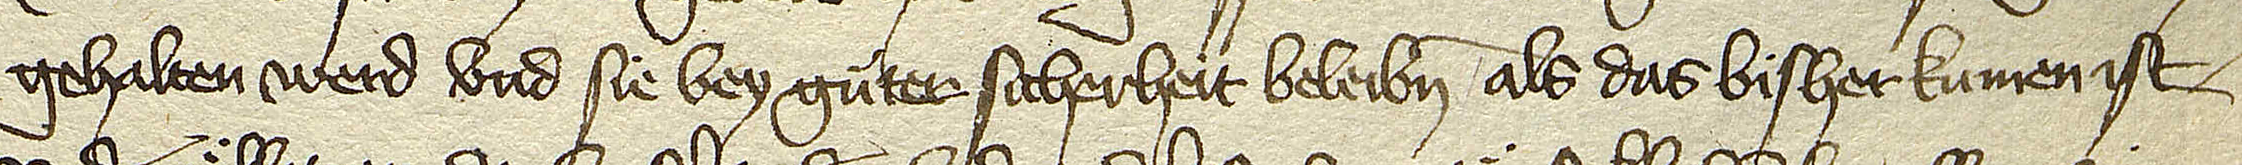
gehalten werd vnd ſie bey güter ſicherheit beleibn* als das biſher kumen iſt /
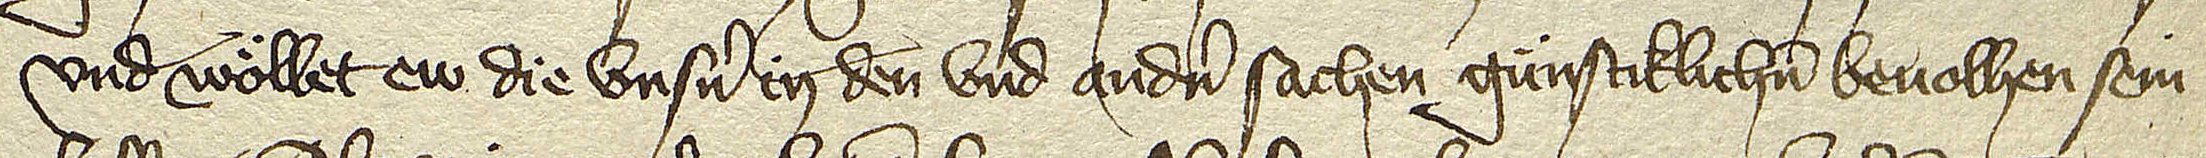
vnd wöllet ew die vnſn* in den vnd andn* ſachen günſtiklichn* beuolhen ſein
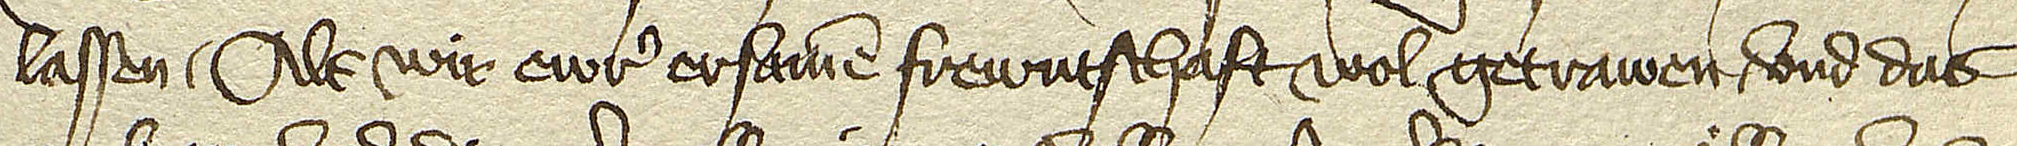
laſſen / Als wir ewr* erſame* frewntſchaft wol getrawen / vnd das
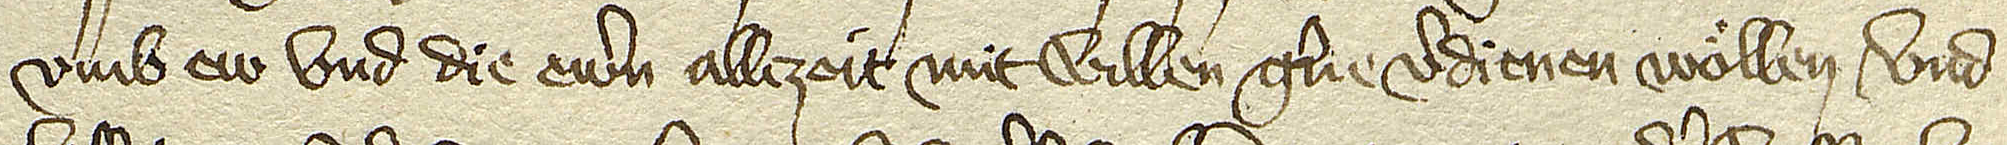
vmb ew vnd die ew*n allcʒeit mit willen g*ne v*dienen wöllen / vnd
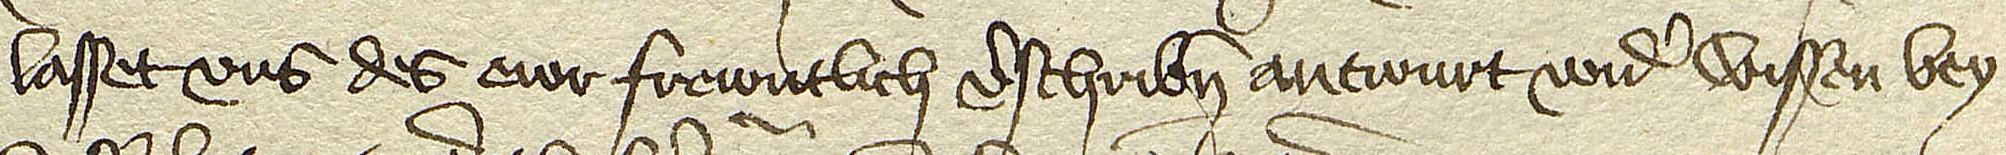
laſſet vns des ewr frewntlich v*ſchribn* antwurt wid* wiſſen bey
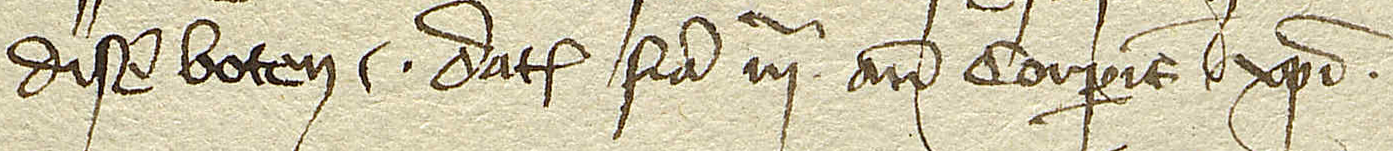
diſe* boten / . Dat* fia* iii* . an* Corp*is xpi* .
